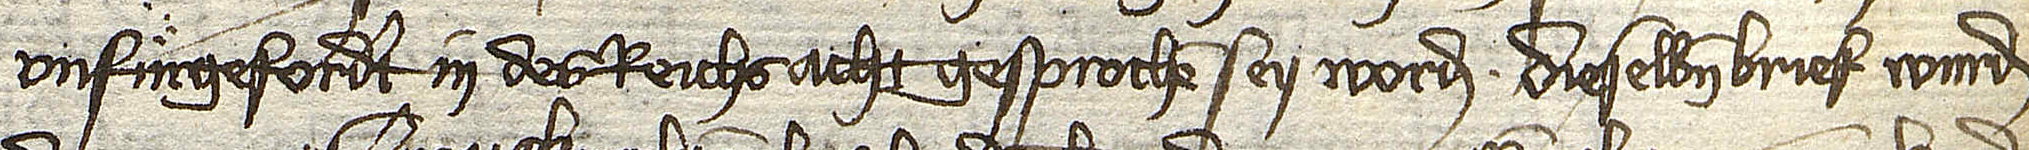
vnfürgeford*t in des Reichs acht geſproche* ſey word* . dieſelbn* brief wurd*
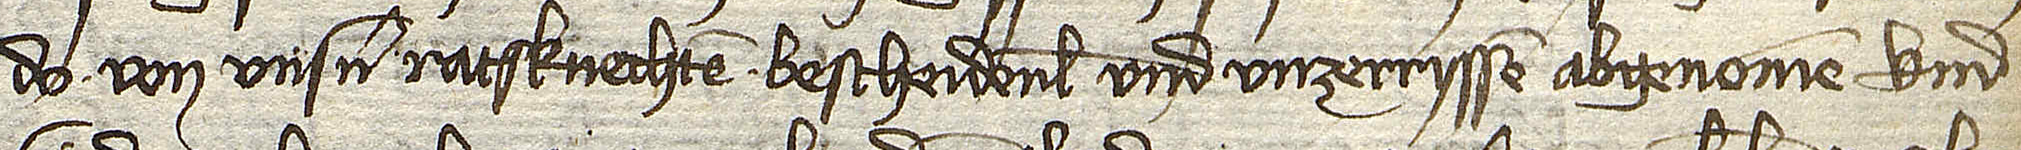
do von vnſn* ratſknechte* . beſcheidenl* vnd vnʒerryſſe* abgenome* Vnd
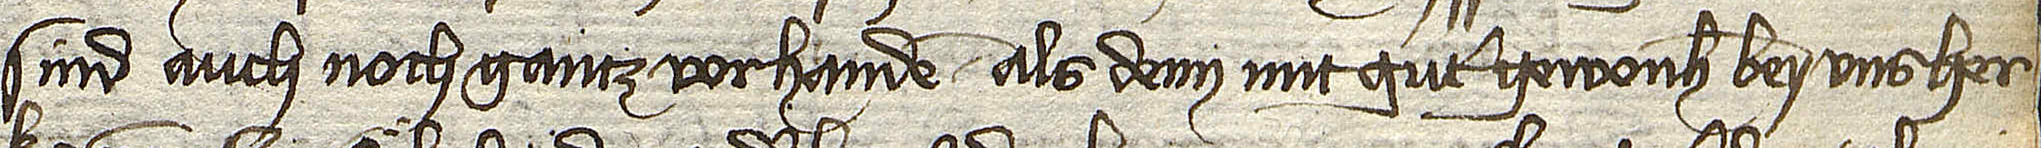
ſind auch noch gancʒ vorhande* / als denn mit gut* gewonh* bey vns her
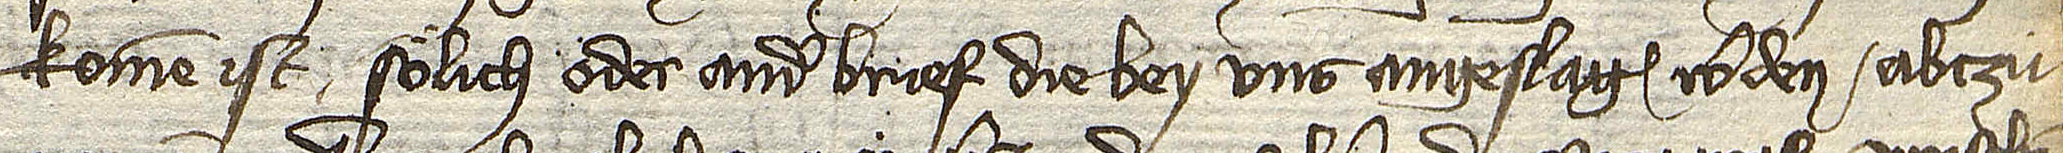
kome* iſt / ſölich oder and* brief die bey vns angeſlag* w*den / abcʒu
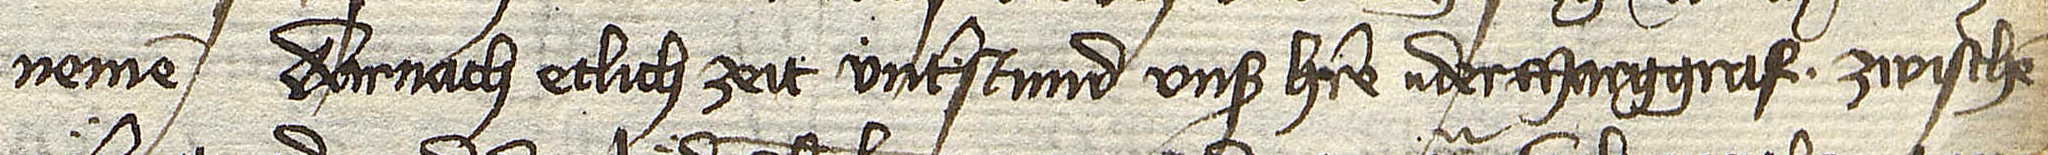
neme* Darnach etlich ʒeit vnt*ſtund vnſ* h*re ~ der Marggraf . ʒwiſche*
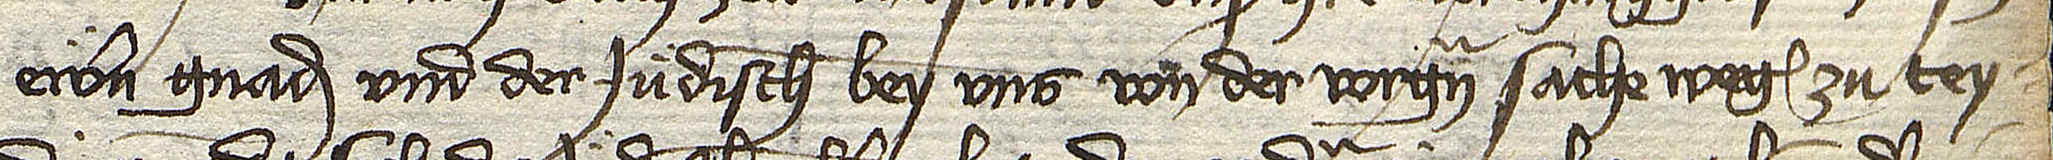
eẅ*n gnad* vnd der Iüdiſch* bey vns von der vorgn* ſache weg* ʒu tey =
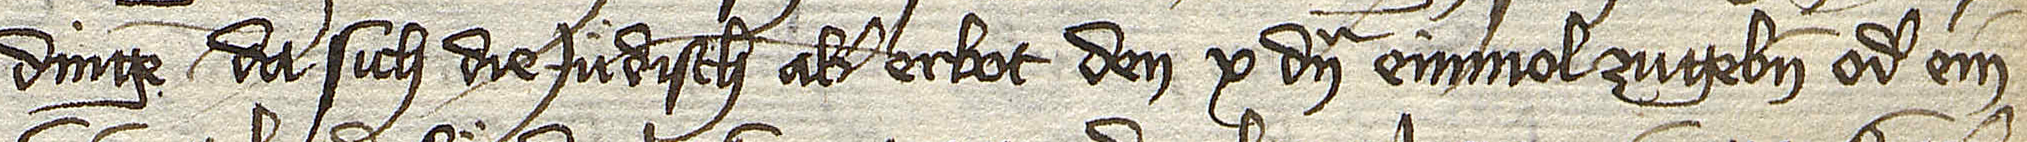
dinge* / da ſich die Iüdiſch* ab* erbot den x dn* einmal ʒu gebn* od* ein
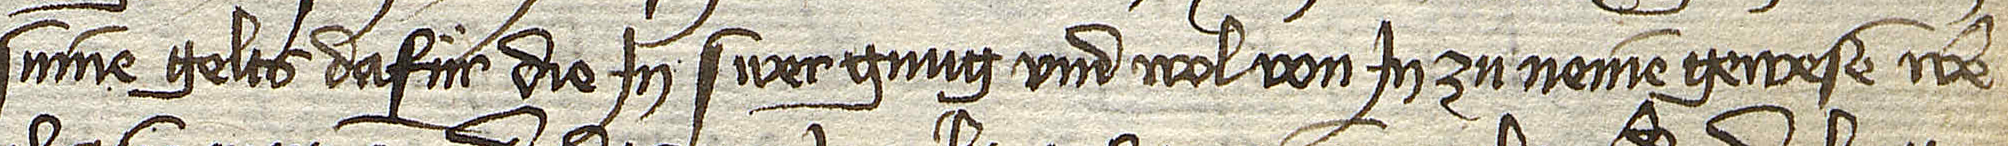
ſum*e gelts dafür die In ſwer gnug vnd wol von In ʒu neme* geweſe* w*e
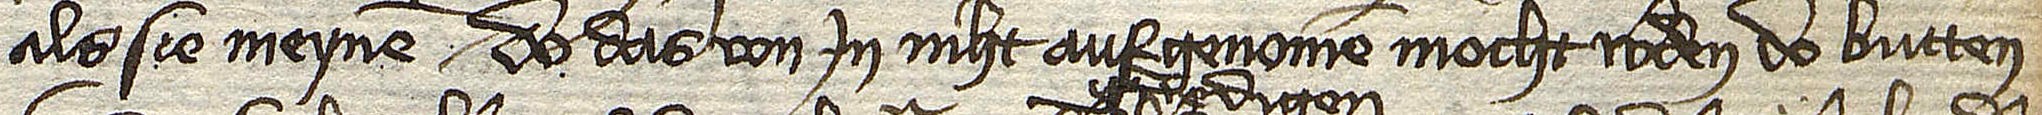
als ſie meyne* / Do das von In niht aufgenome* mocht w*den Do butten
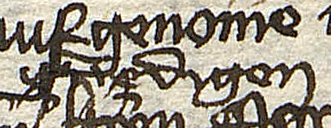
gnedigen
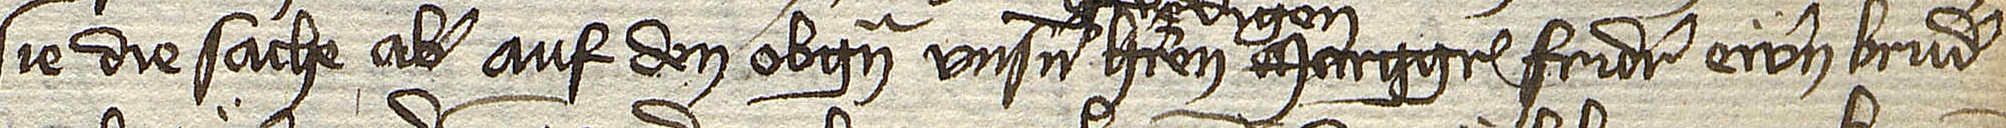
ſie die ſache ab* auf den obgn* vnſn* h*ren Marggr* fridr* eẅ*n brud*
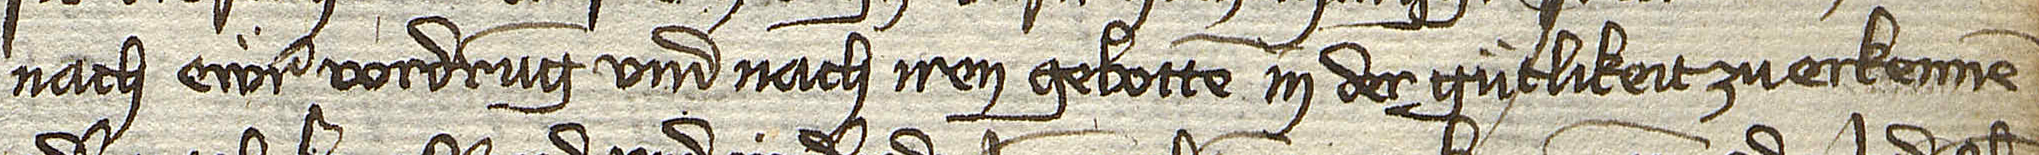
nach eẅr* vordru*g vnd nach iren gebotte* in der gütlikeit ʒu erkenne*
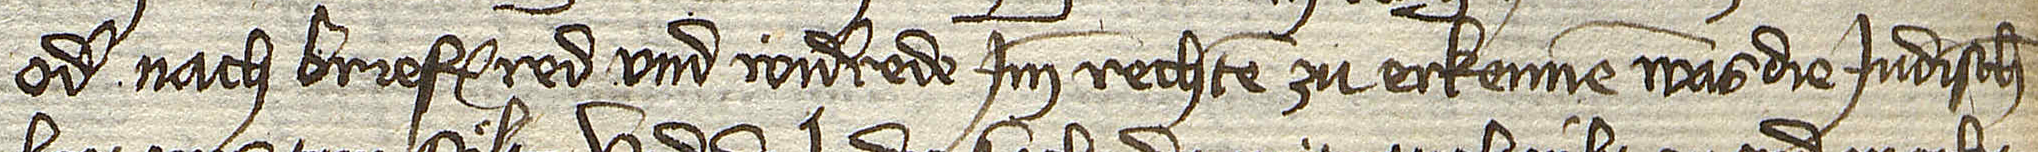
od* nach brief* red vnd wid*rede Im* rechte* ʒu erkenne* was die Iudiſch*
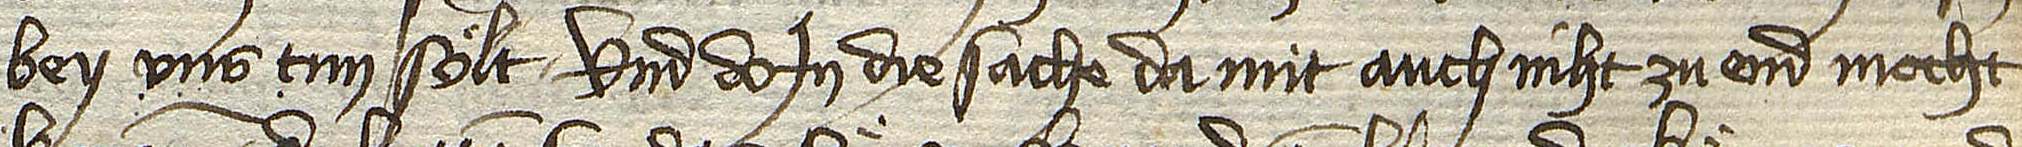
bey vns tun ſölt / Vnd do In die ſache da mit auch niht ʒu eid mocht
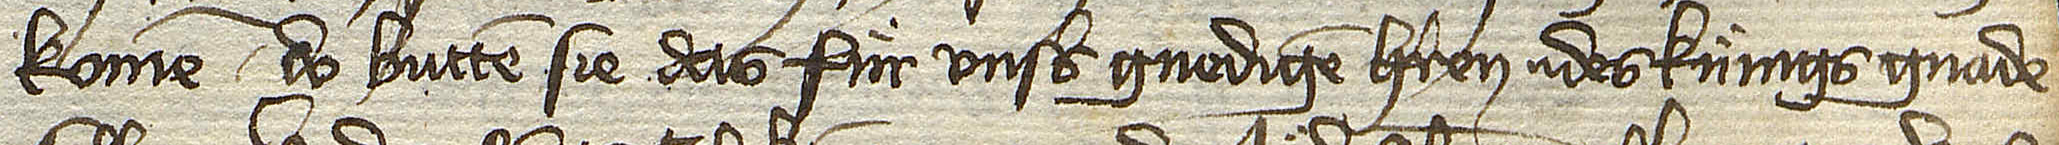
kome* / do bitte* ſie das für vnſ*s gnedige* h*ren ~ des künigs gnade
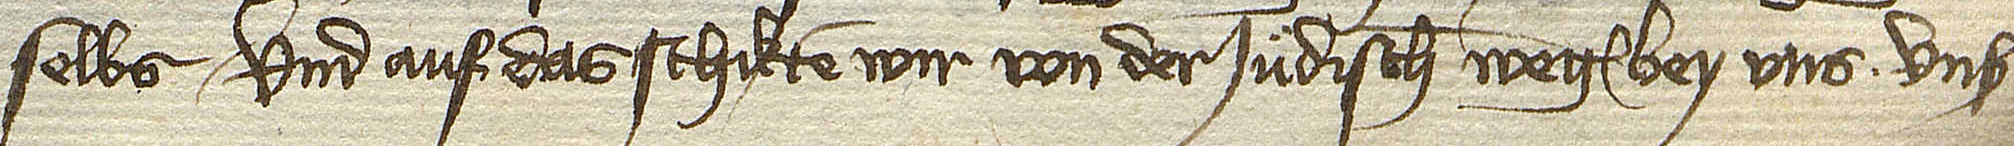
ſelbs / Vnd auf das ſchikte* wir von der Iüdiſch* weg* bey vns . Vnſ*
